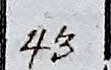43
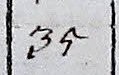35
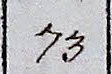73
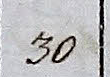30
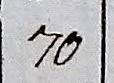70
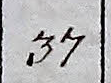37
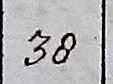38
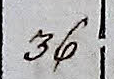36
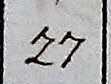27
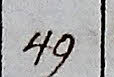49
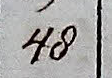48
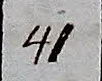41
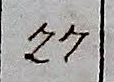27
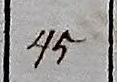45
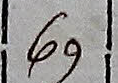69
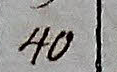40
